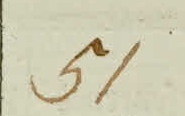51
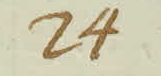24
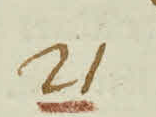21
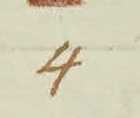4
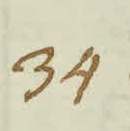34
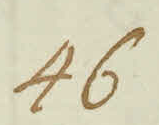46
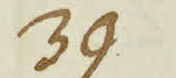39
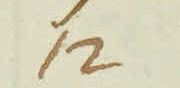12
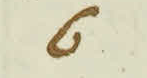6
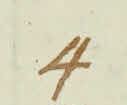4
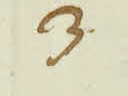3
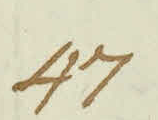47
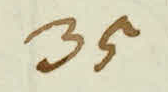35
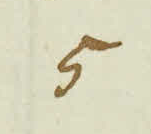5
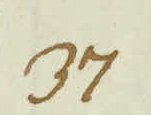37
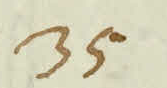35
